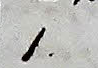1.
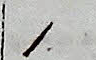1.
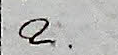2.
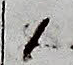1.
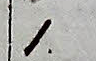1.
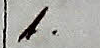1.
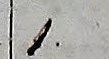1.
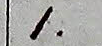1.
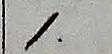1.
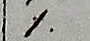1.
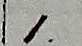1.
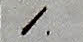1.
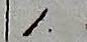1.
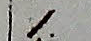1.
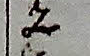2
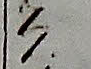1.
